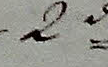2
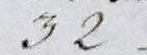32
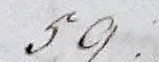59
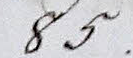85
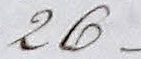26
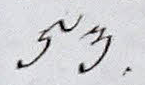53
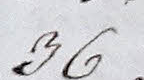36
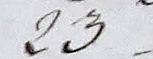23
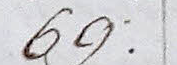69.
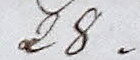28
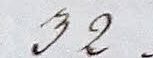32
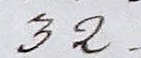32
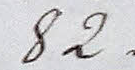82
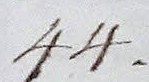44
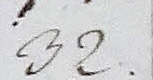32
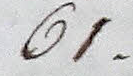61
